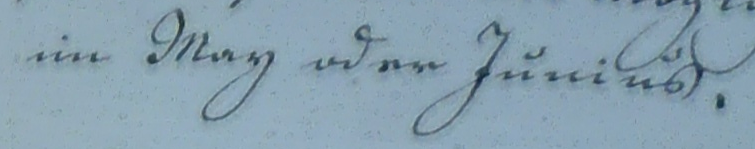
im May oder Junius.
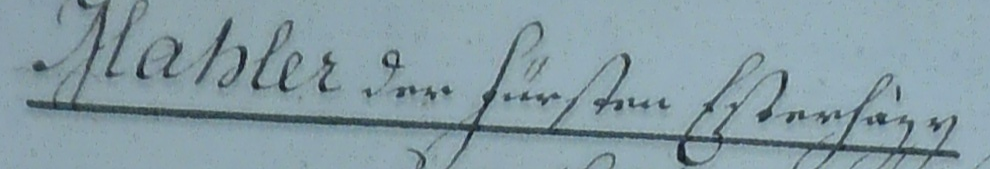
Mahler der Fürsten Esterhàzy
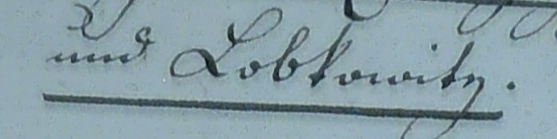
und Lobkowitz.
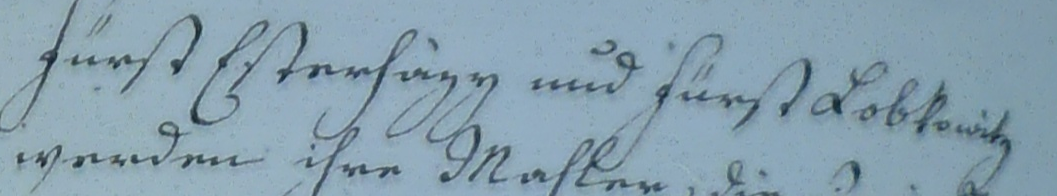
Fürst Esterhàzy und Fürst Lobkowitz
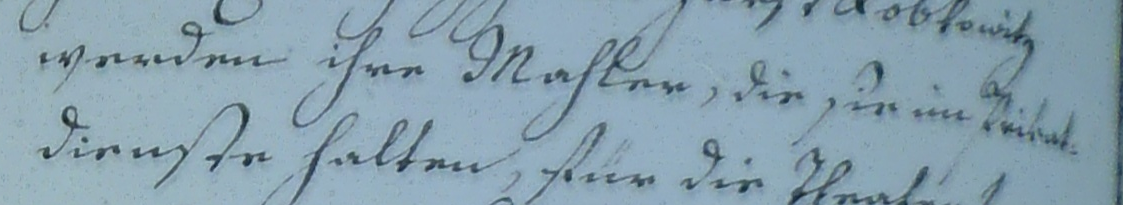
werden ihre Mahler, die sie im Privat¬
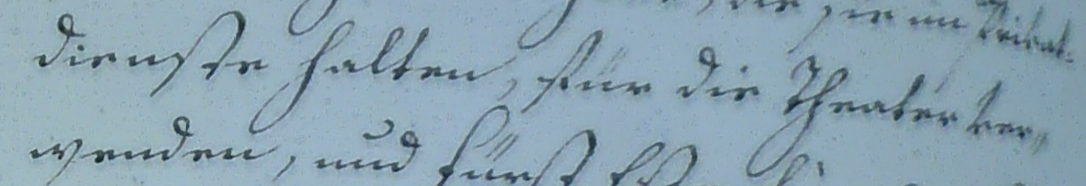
dienste halten, für die Theater ver¬
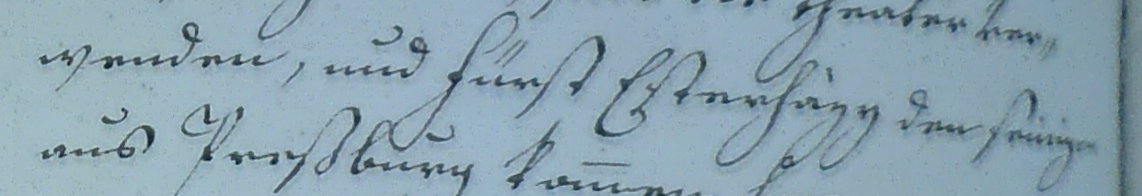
wenden, und Fürst Esterhàzy den seinigen
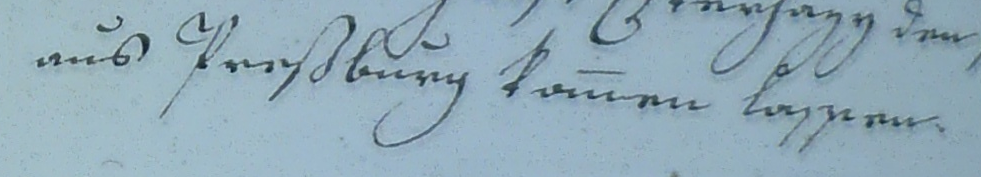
aus Preßburg kom̅en lassen.
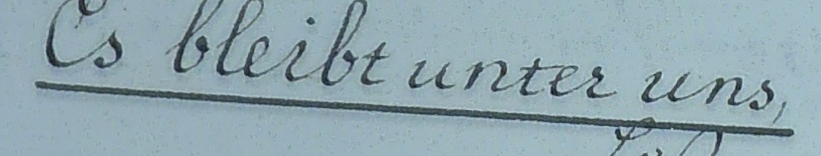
Es bleibt unter uns,
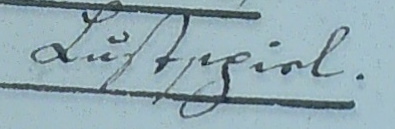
Lustspiel.
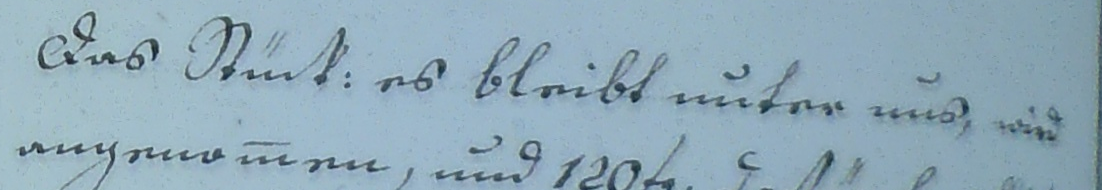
Das Stück: es bleibt unter uns, wird
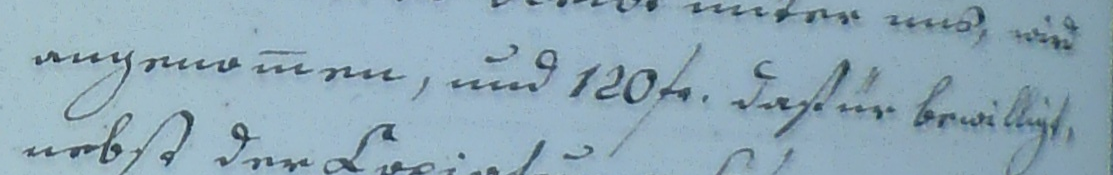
angenom̅en, und 120fr. dafür bewilligt,
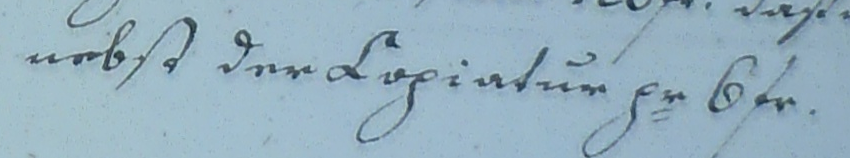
nebst der Copiatur pr 6 fr.
